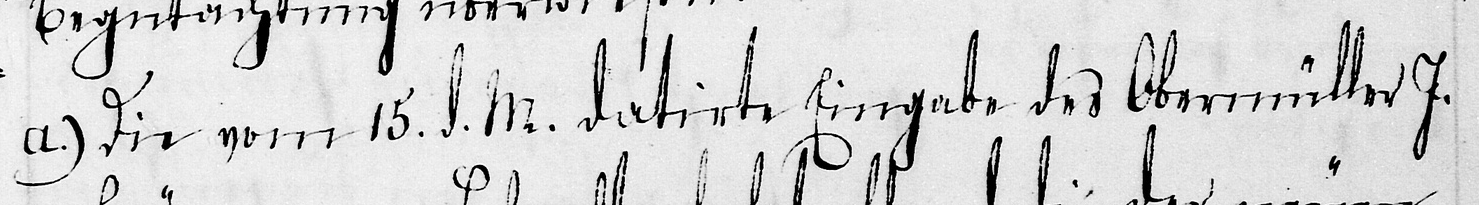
a.) Die vom 15. d. M. datirte Eingabe des Obermüller J.
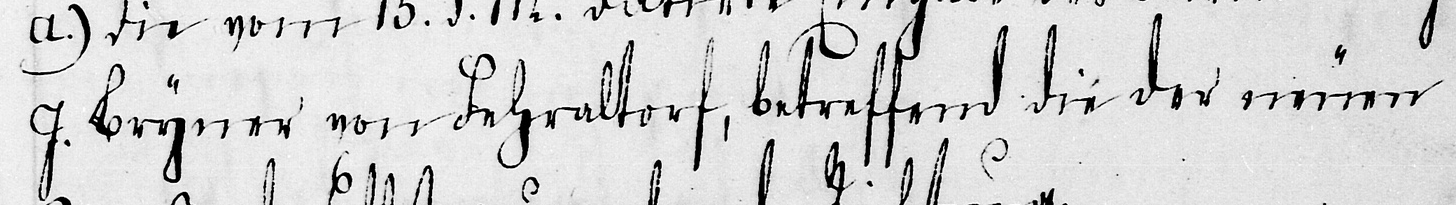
J. Bryner von Fehraltorf, betreffend die der neuen
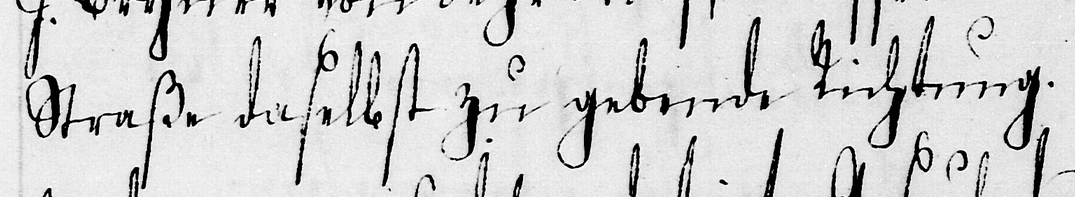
Straße daselbst zu gebende Richtung.
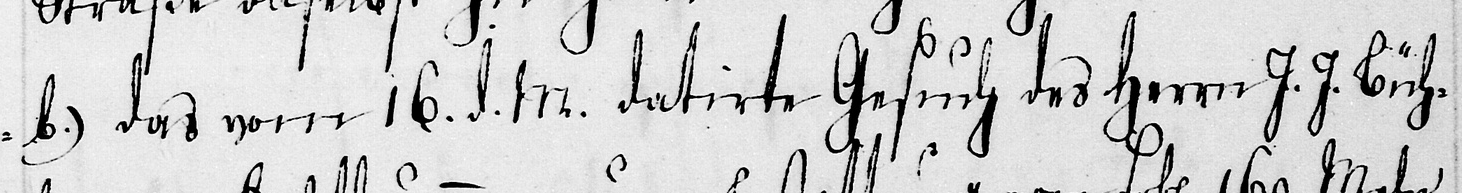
b.) Das vom 16. d. M. datirte Gesuch des Herrn J. J. Bü¬
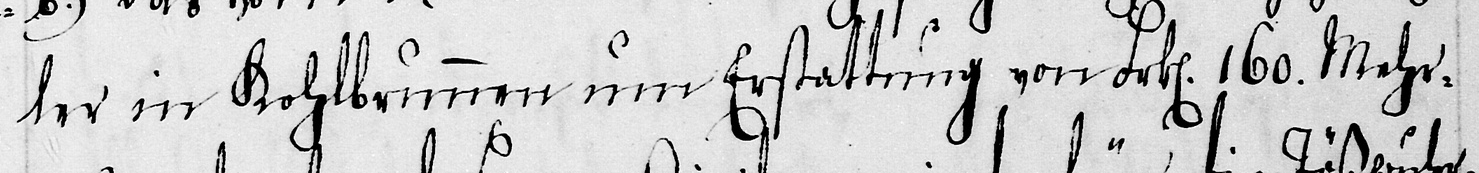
hler in Kohlbrunnen um Erstattung von Frk[en]. 160. Mehr¬
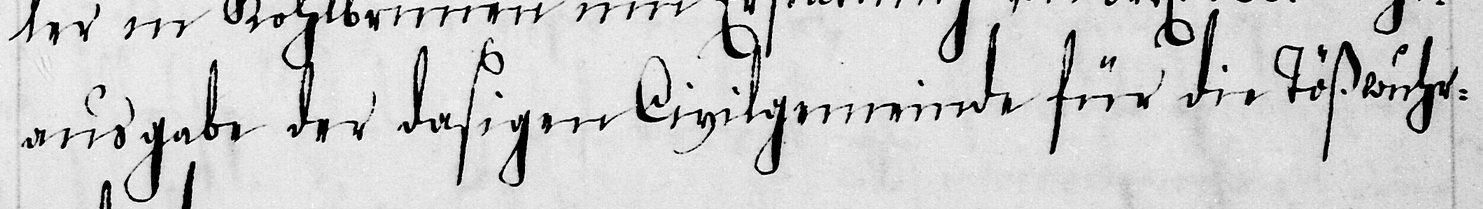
ausgabe der dasigen Civilgemeinde für die Tößwuhr¬
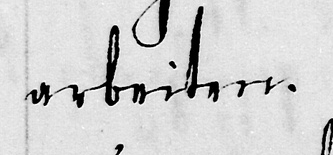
arbeiten.
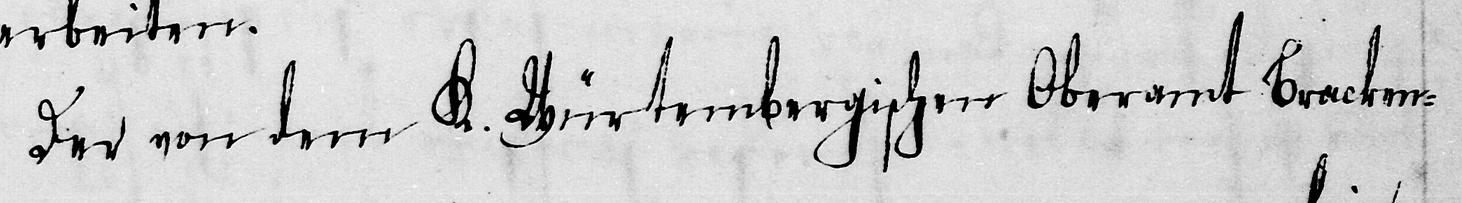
Der von dem K. Würtembergischen Oberamt Bracken-
